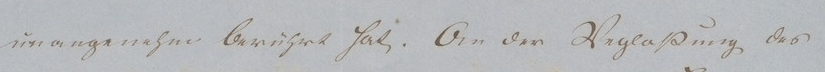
unangenehm berührt hat. An der Weglaßung des
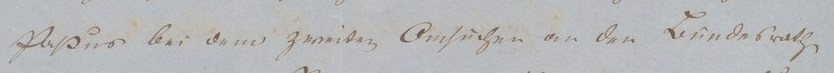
Paßus bei dem zweiten Ansuchen an den Bundesrath
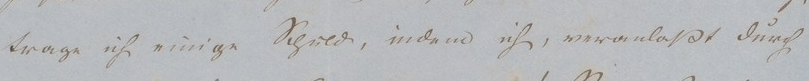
trage ich einige Schuld, indem ich, veranlaßt durch
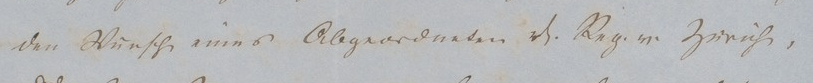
den Wunsch eines Abgeordneten d. Reg. v. Zürich,
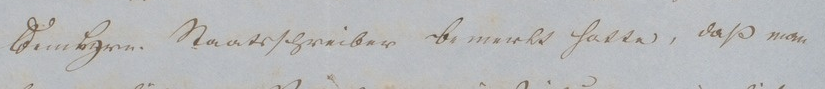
dem Hrn. Staatsschreiber bemerkt hatte, daß man
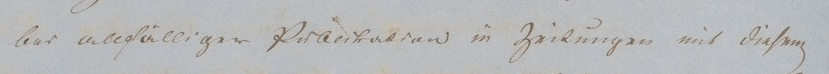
bei allfälliger Publikation in Zeitungen mit diesem
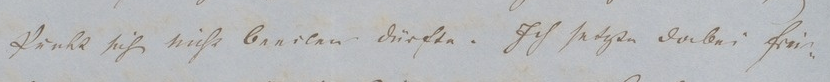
Punkt sich nicht beeilen dürfte. Ich setzte dabei frei-
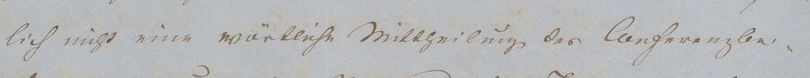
lich nicht eine wörtliche Mittheilung der Conferenzbe-
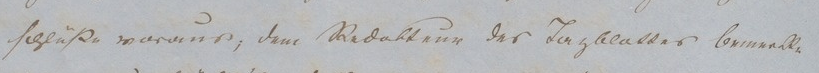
schlüße voraus; dem Redakteur des Tagblattes bemerkte
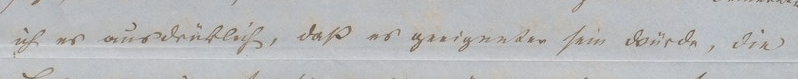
ich es ausdrüklich, daß es geeigneter sein würde, die
